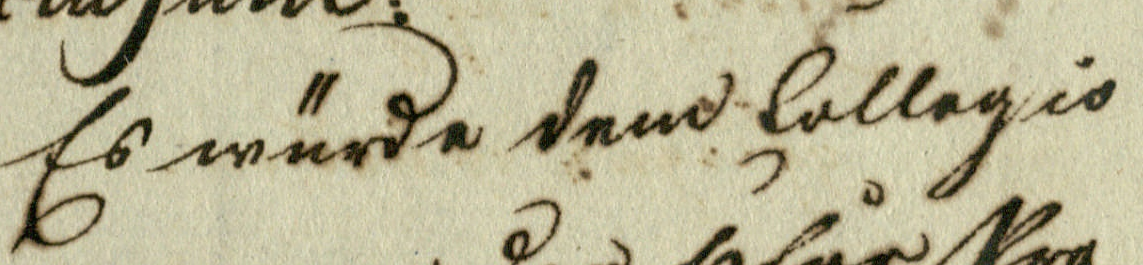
Es würde dem Collegio
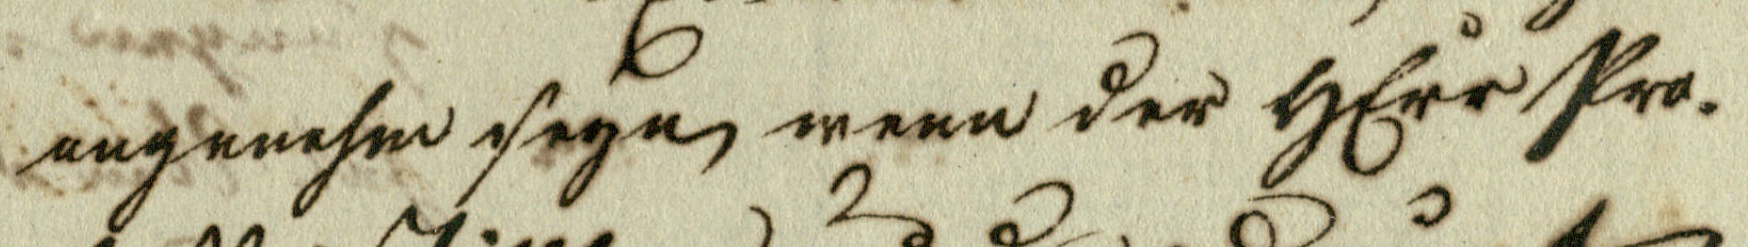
angenehm seyn, wenn der Herr Pro¬
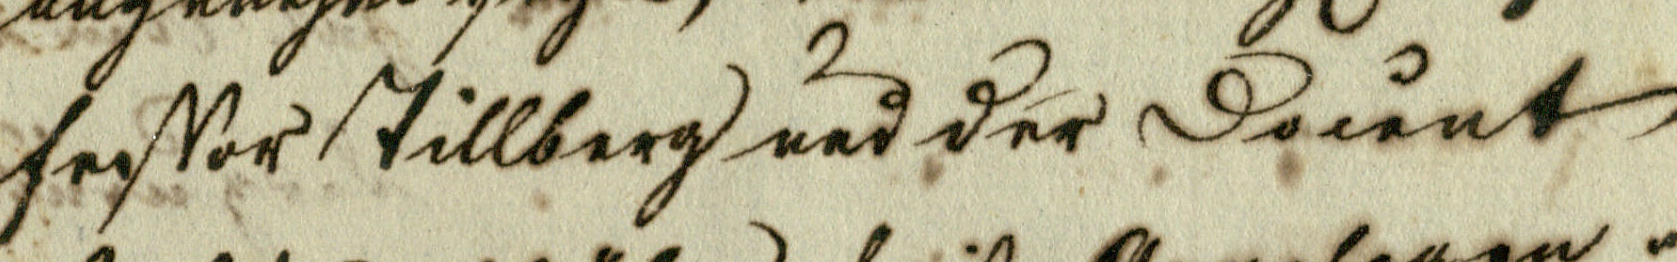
fessor Tillberg und der Docent
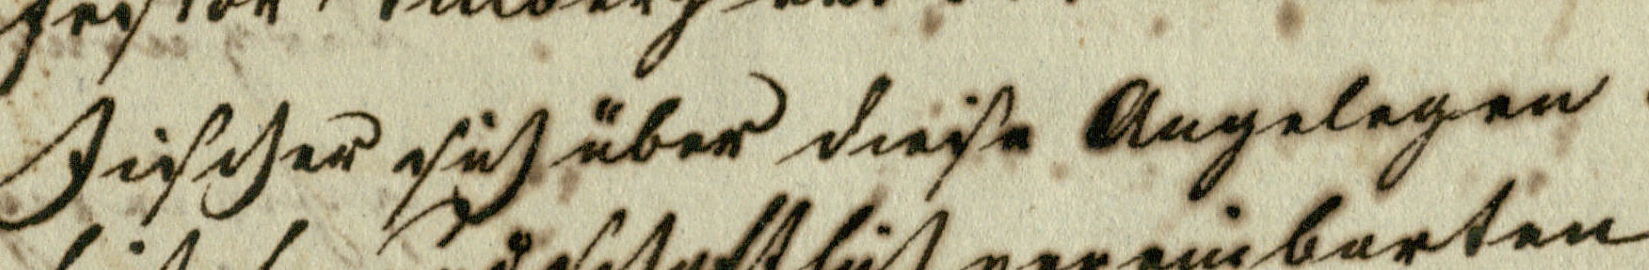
Fischer sich über diese Angelegen¬
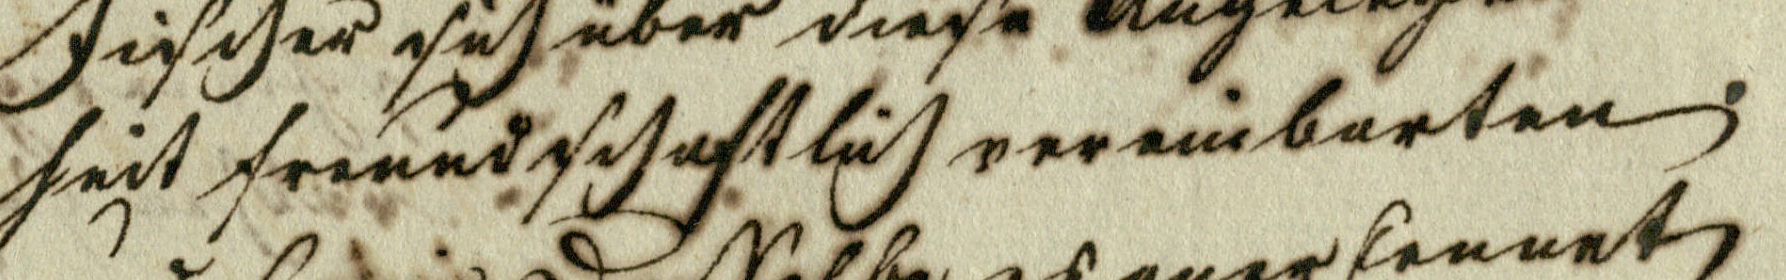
heit freundschaftlich vereinbarten;
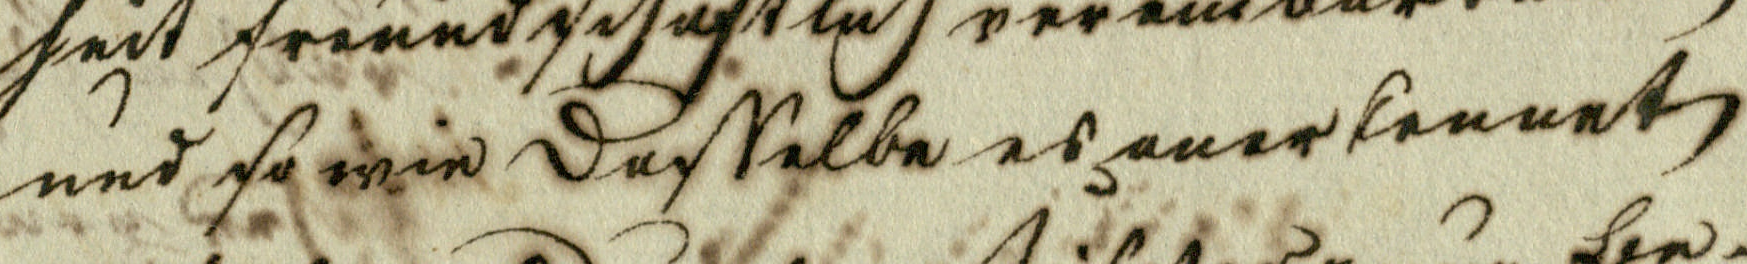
und so wie Dasselbe es anerkennet,
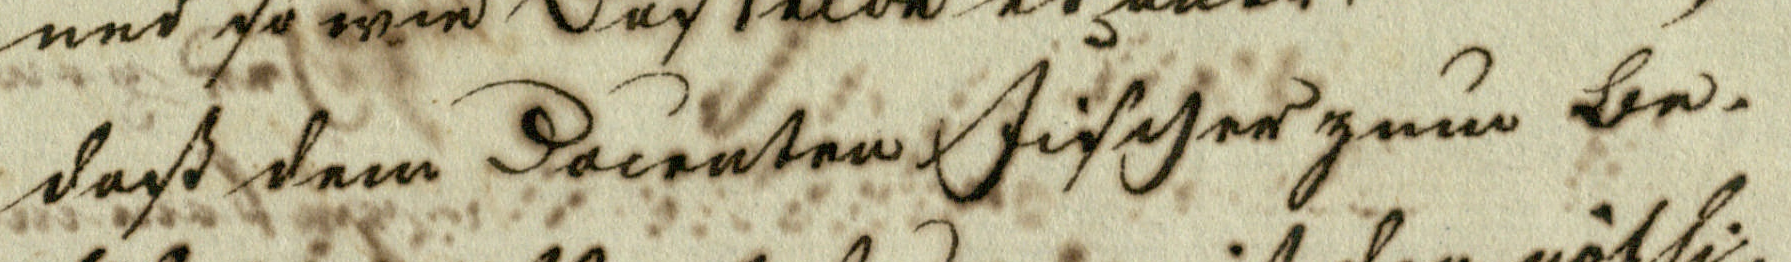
daß dem Docenten Fischer zum Be¬
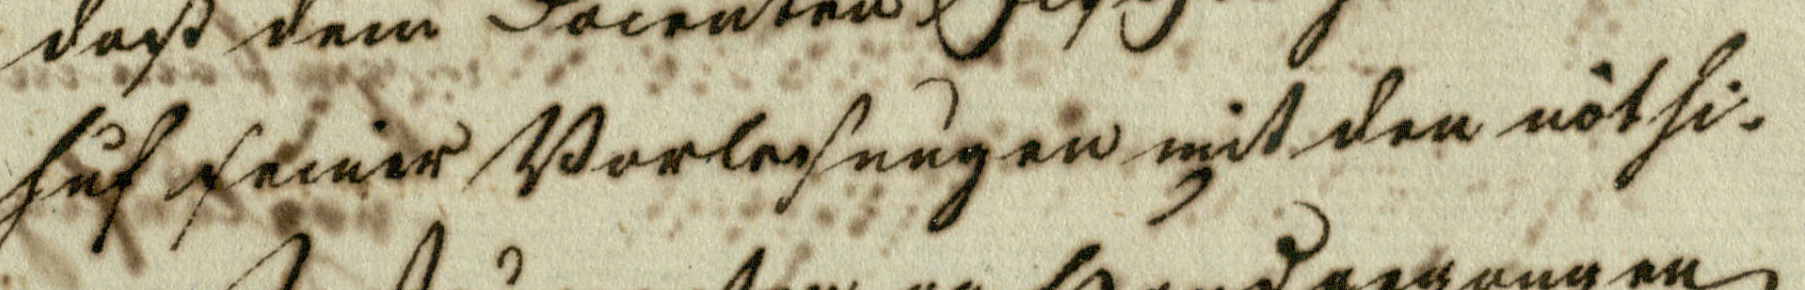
huf seiner Vorlesungen mit den nöthi¬
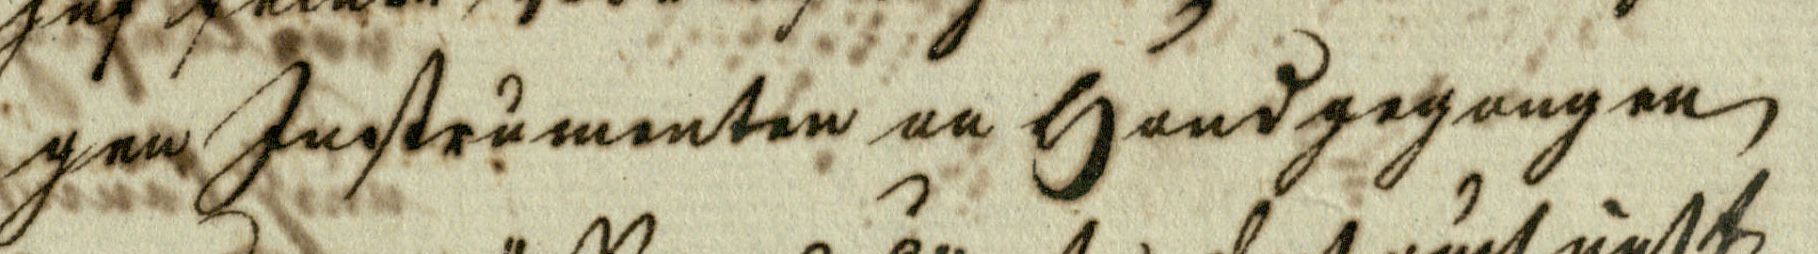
gen Instrumenten an Handgegangen
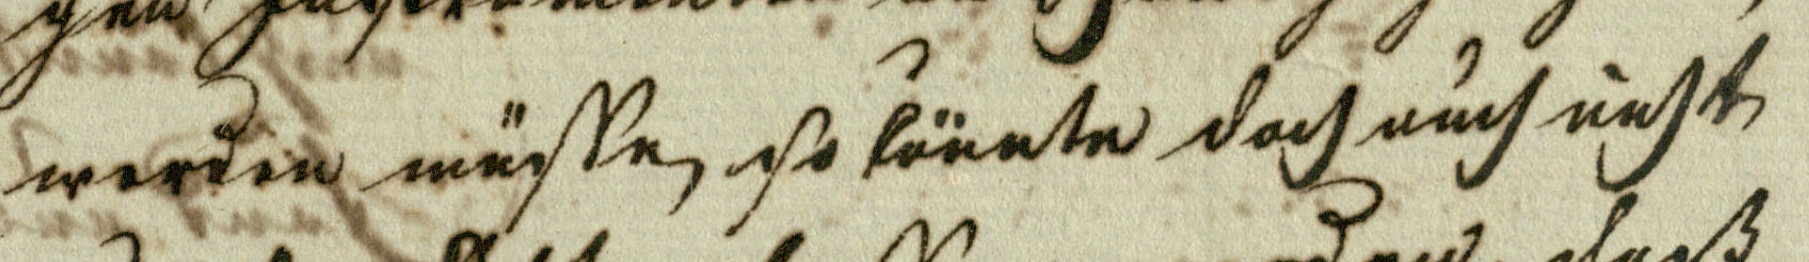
werden müsse, so könnte doch auch nicht
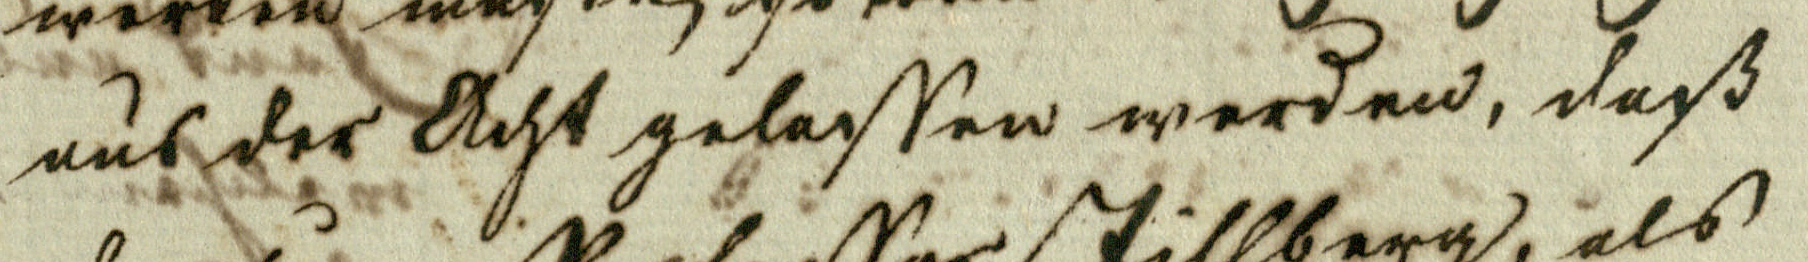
aus der Acht gelassen werden, daß
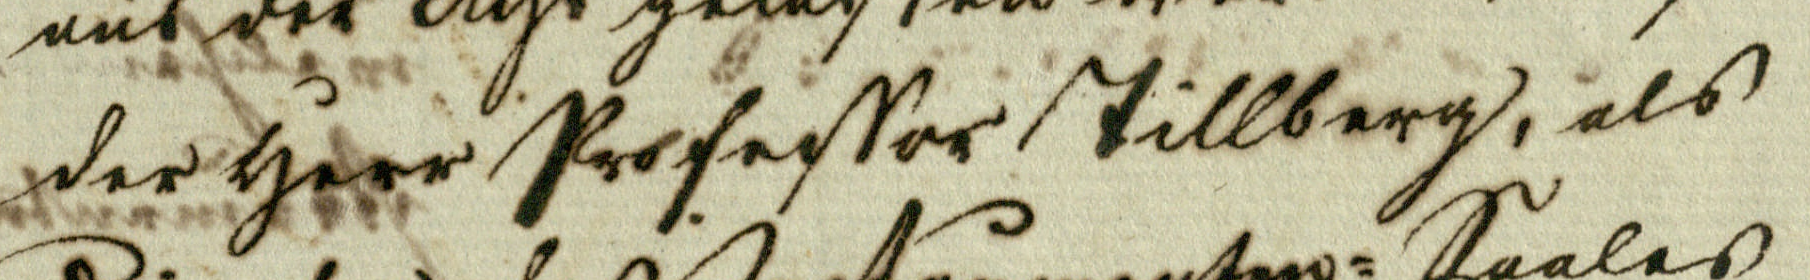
der Herr Professor Tillberg, als
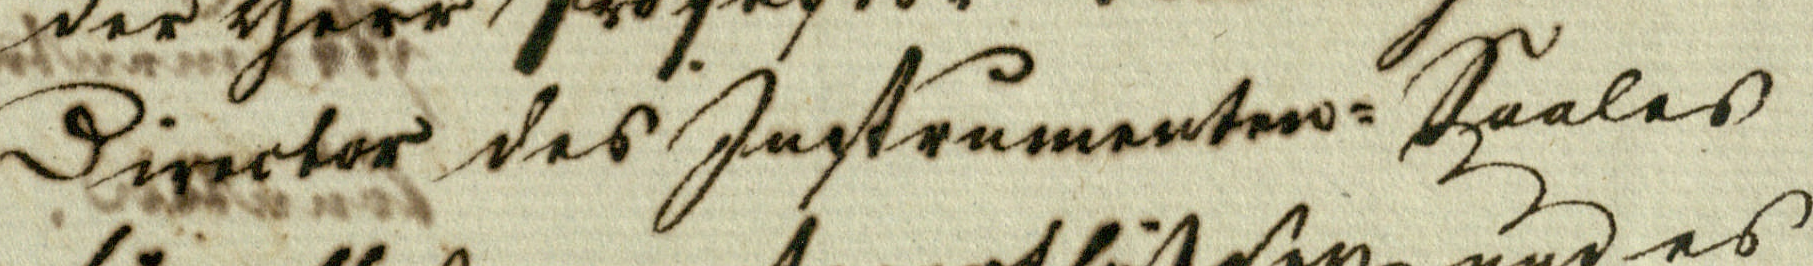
Director des Instrumenten- Saales
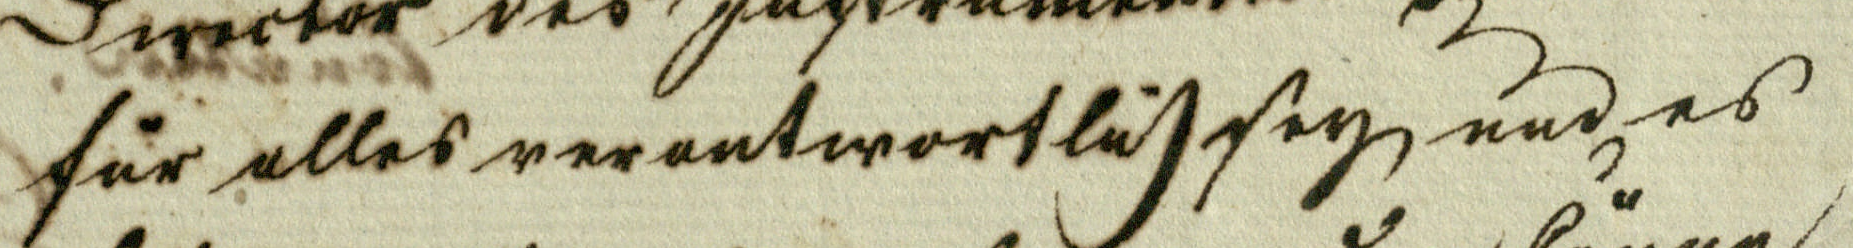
für alles verantwortlich sey und es
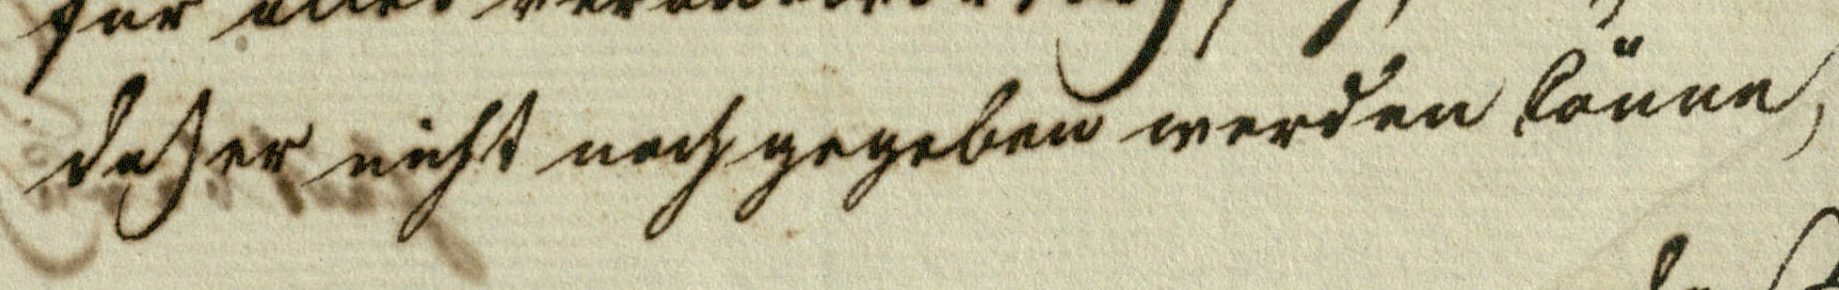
daher nicht nachgegeben werden könne,
